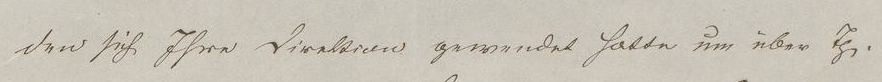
den sich Ihre Direktion gewendet hatte um über Th.
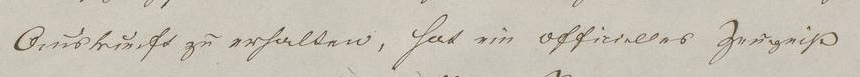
Auskunft zu erhalten, hat ein officielles Zeugniß
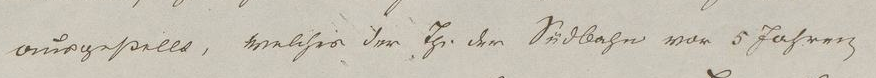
ausgestellt, welches der Th. der Südbahn vor 5 Jahren
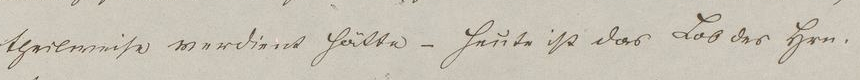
theilweise verdient hätte – heute ist das Lob des Hrn.
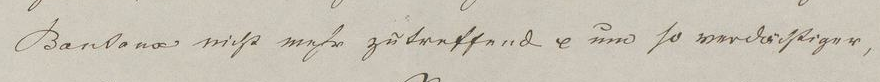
Bantaux nicht mehr zutreffend & um so verdächtiger,
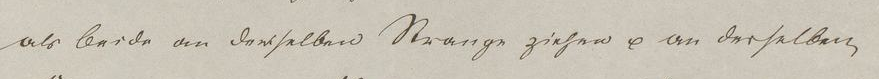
als beide an demselben Strange ziehen & an derselben
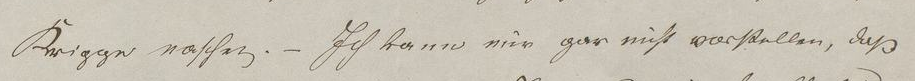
Krippe naschen. – Ich kann mir gar nicht vorstellen, daß
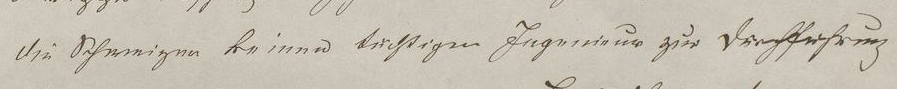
die Schweizer keinen tüchtigen Ingenieur zur Durchführung
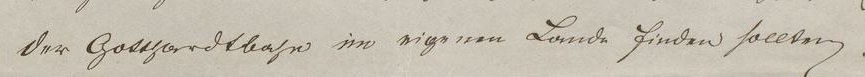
der Gotthardtbahn im eigenen Lande finden sollten.» –
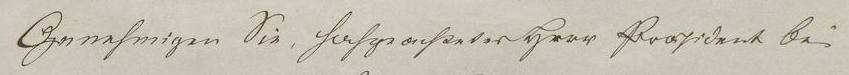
Genehmigen Sie, hochgeachteter Herr Präsident bei
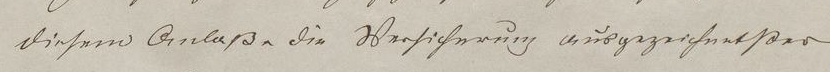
diesem Anlaße die Versicherung ausgezeichnetster
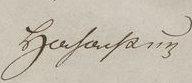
Hochachtung
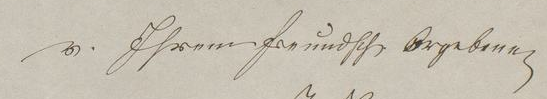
v. Ihrem freundsch. ergebenen
